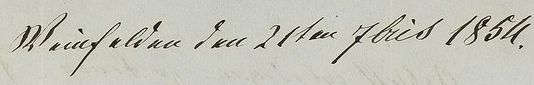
Weinfelden den 21ten 7bris 1854.
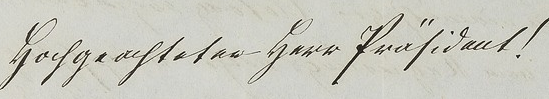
Hochgeachteter Herr Präsident!
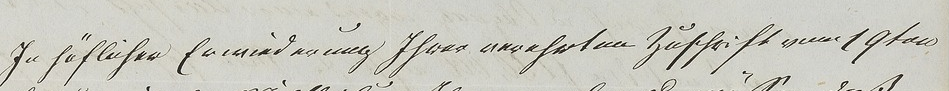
In höflicher Erwiederung Ihrer verehrten Zuschrift vom 19ten
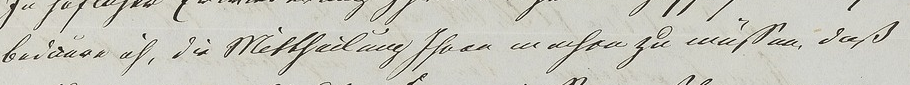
bedaure ich, die Mittheilung Ihnen machen zu müssen, daß
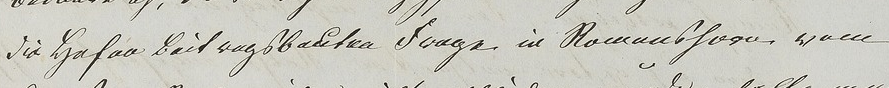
die Hafen Beitragsbauten Frage in Romanshorn vom
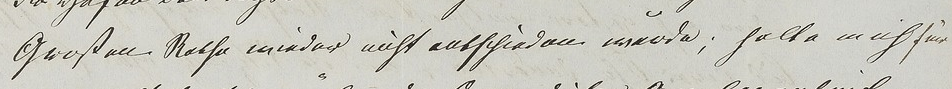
Großen Rathe wieder nicht entschieden wurde; halte mich für
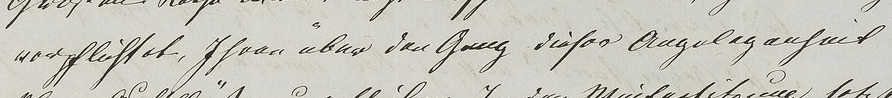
verpflichtet, Ihnen über den Gang dieser Angelegenheit
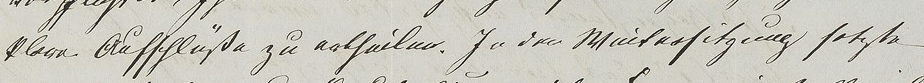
klare Aufschlüße zu ertheilen. In der Wintersitzung setzte
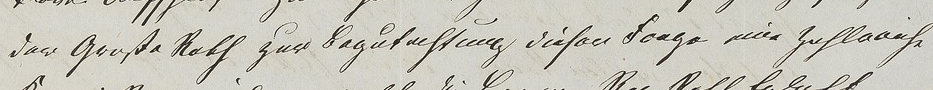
der Große Rath zur Begutachtung dieser Frage eine zahlreiche
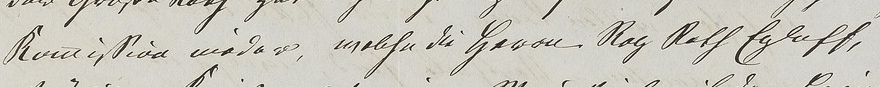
Kommission nieder, welche die Herrn RegRath Egloff,
